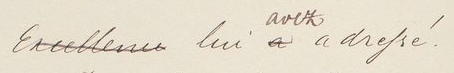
Excellence lui aavez adressé.
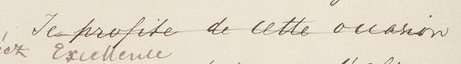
Je profite de cette occasion
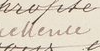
exprimer
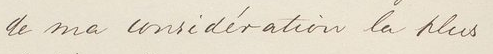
de ma considération la plus
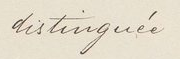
distinguée
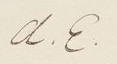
A. E.
